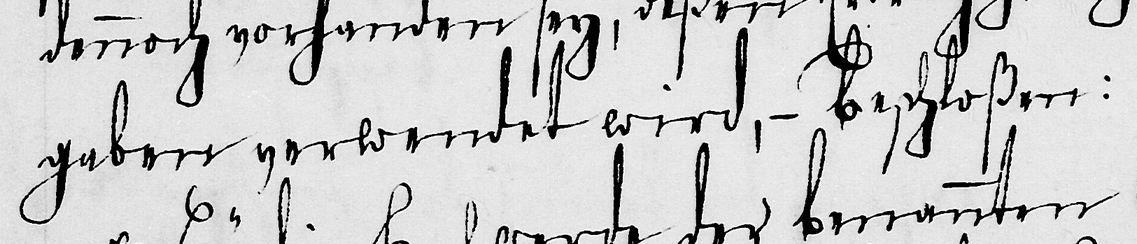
sgaben verwendet wird, – beschloßen:
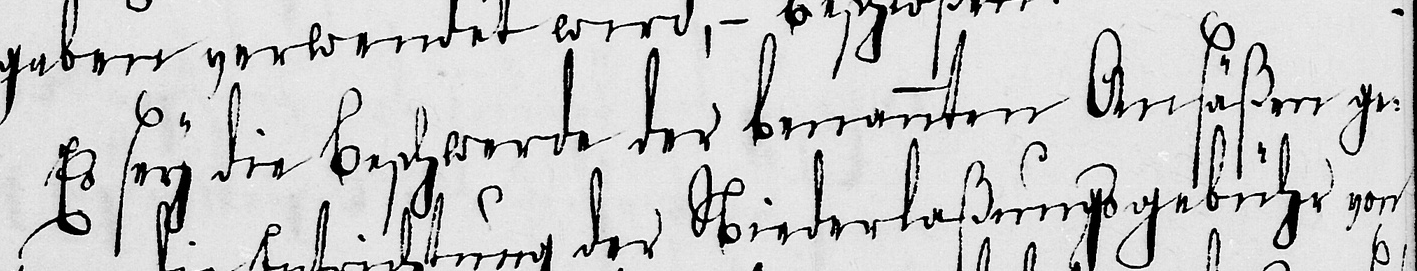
Es sey die Beschwerde der benannten Ansäßen ge¬
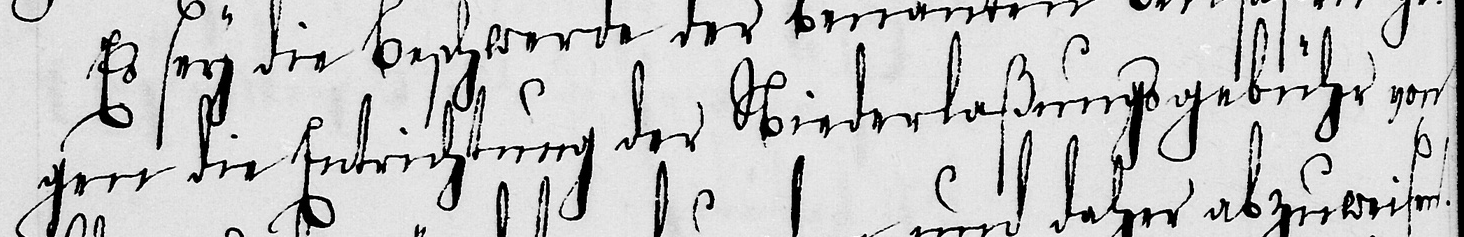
gen die Entrichtung der Niederlaßungsgebühr von
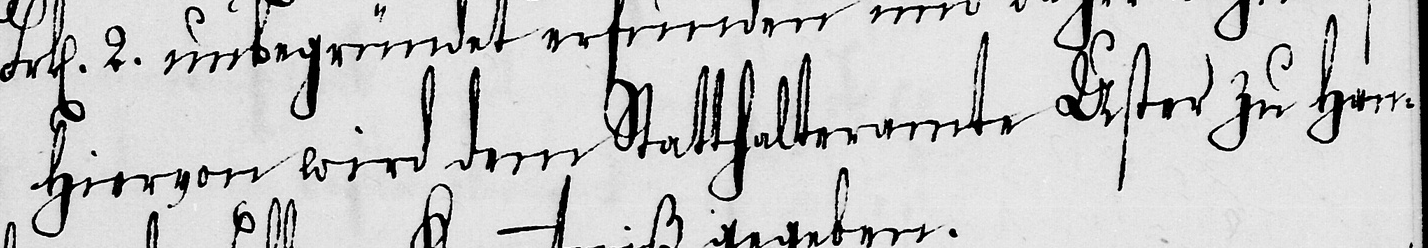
Hiervon wird dem Statthalteramt Uster zu Han¬
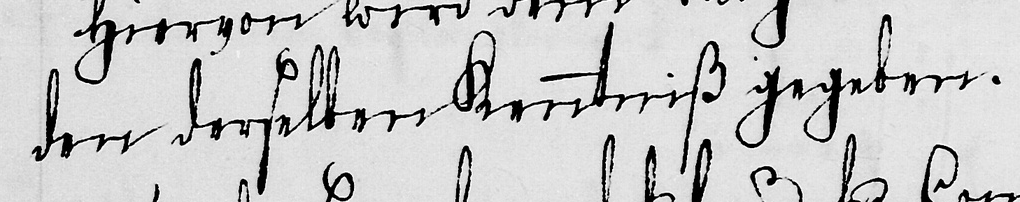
den derselben Kenntniß gegeben.
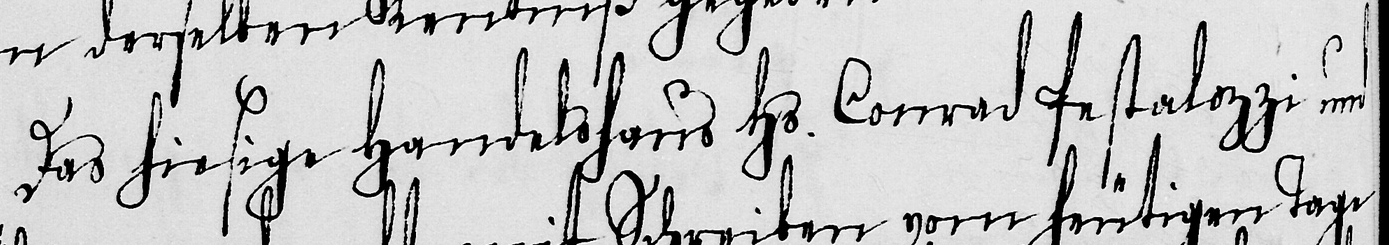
Das hiesige Handelshaus Hs. Conrad Pestalozzi
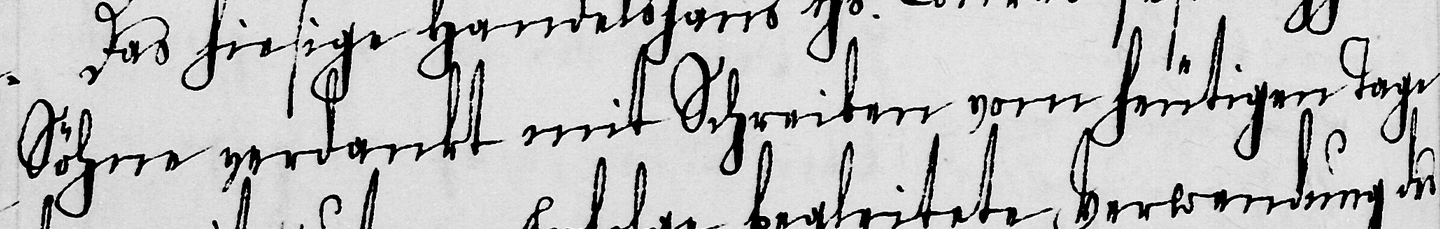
Söhne verdankt mit Schreiben von heutigen Tage
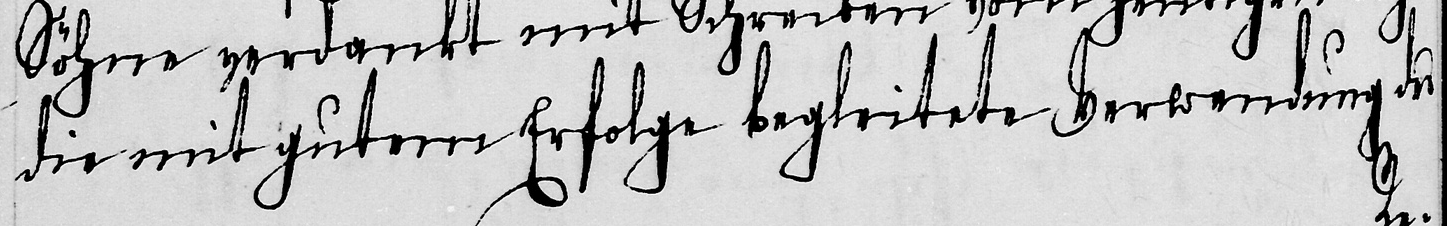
die mit gutem Erfolge begleitete Verwendung
